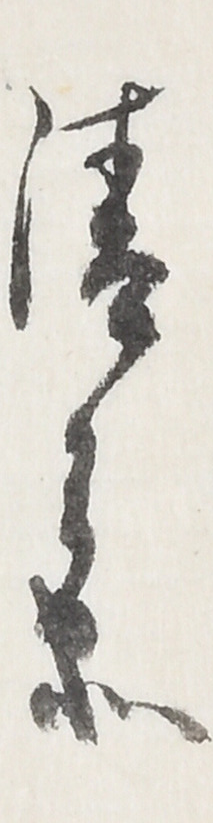清兵衛
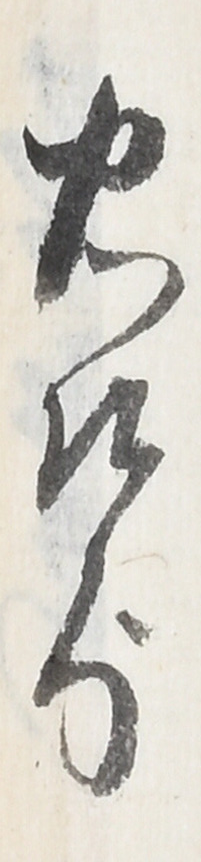忠左衛門
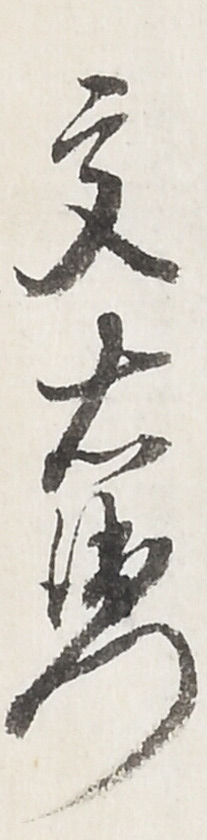文右衛門

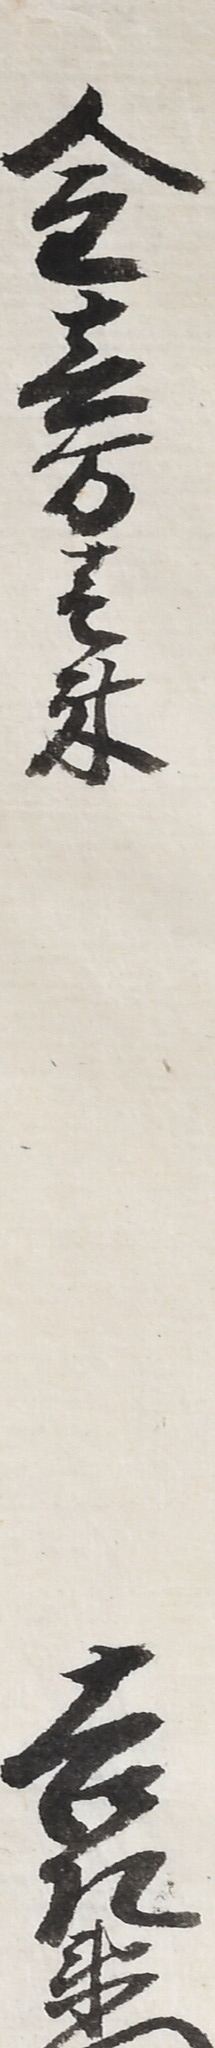一金壱分壱朱吉左衛門
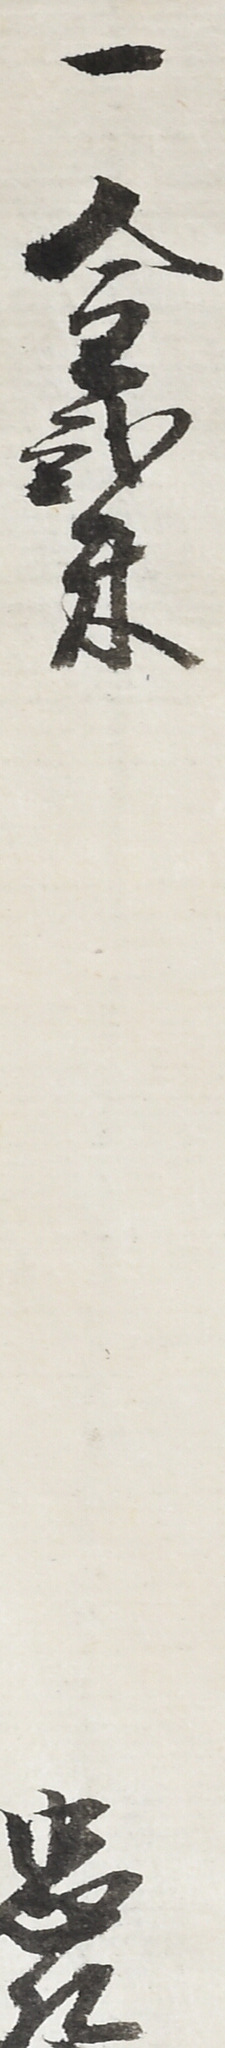一金弐朱忠左衛門
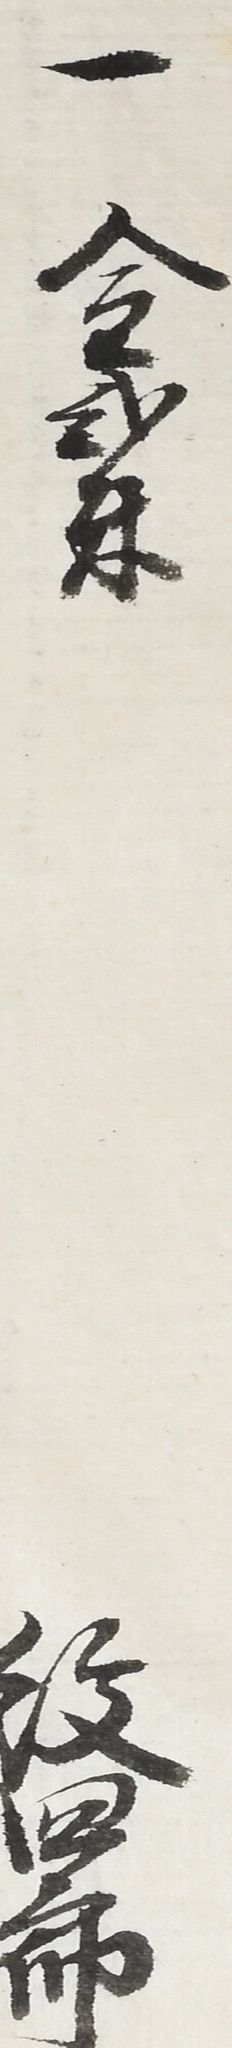一金弐朱紋四郎

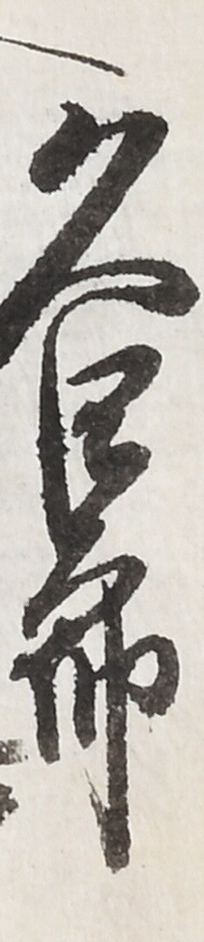久四郎
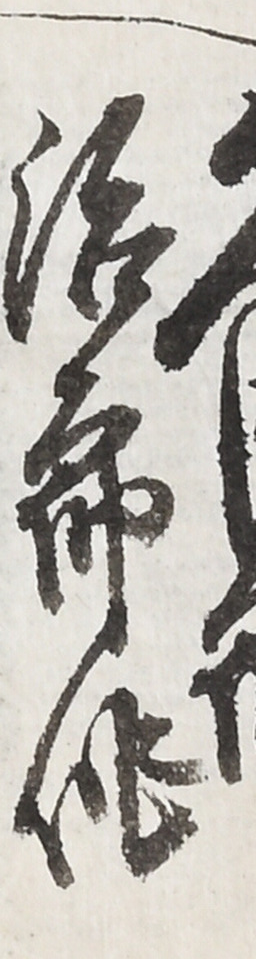治郎作
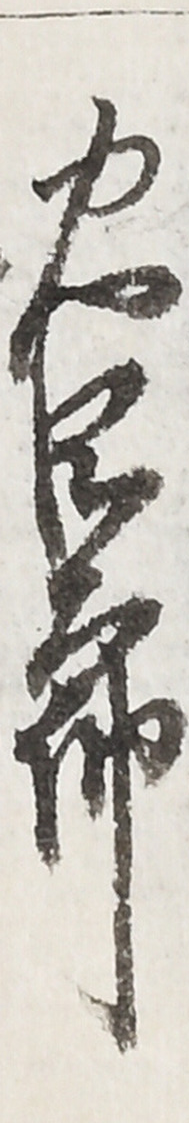久四郎
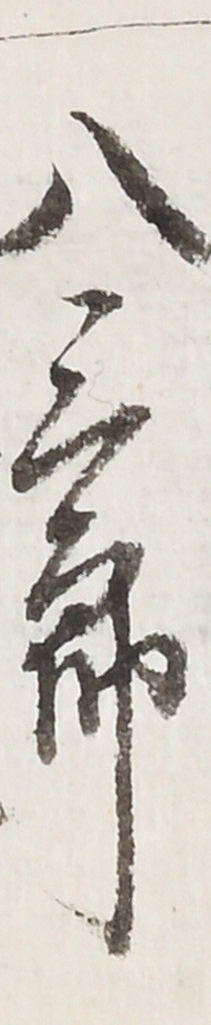八三郎
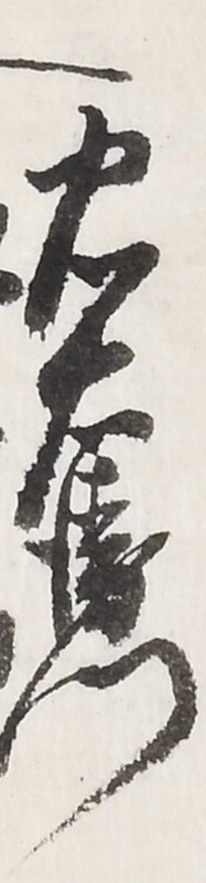忠右衛門
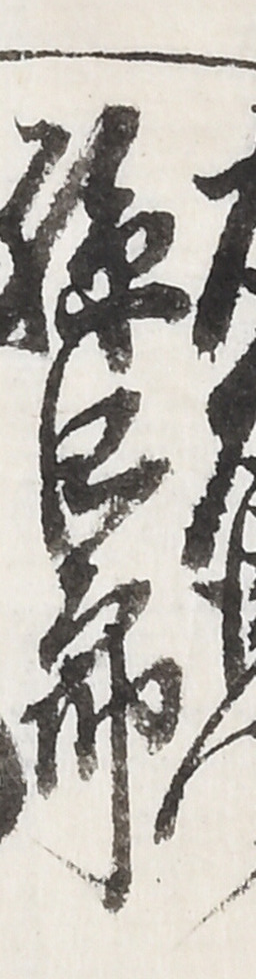孫四郎
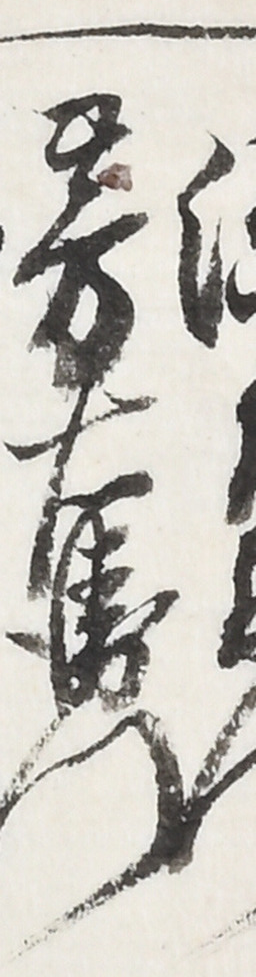芳右衛門
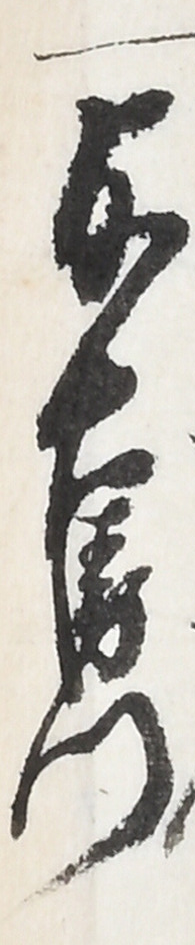忠右衛門
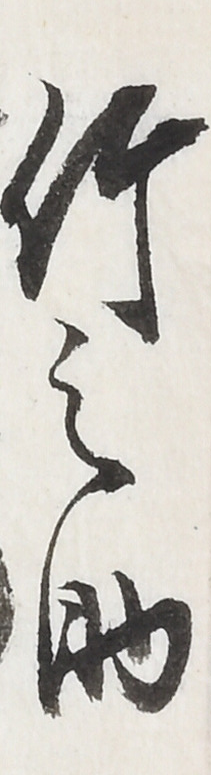竹之助
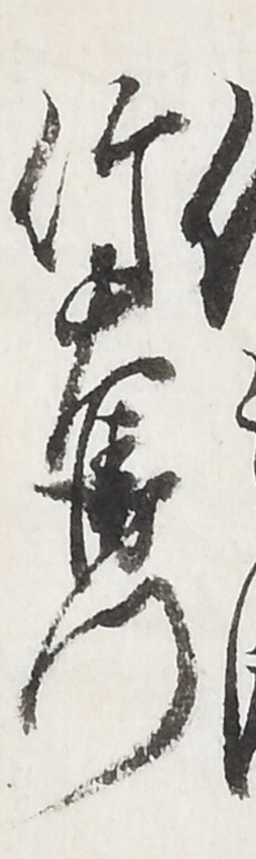忠右衛門
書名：御拝地百五拾年御祝儀献上御目録名前
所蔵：伊那市立高遠町図書館・合同会社AMANE
